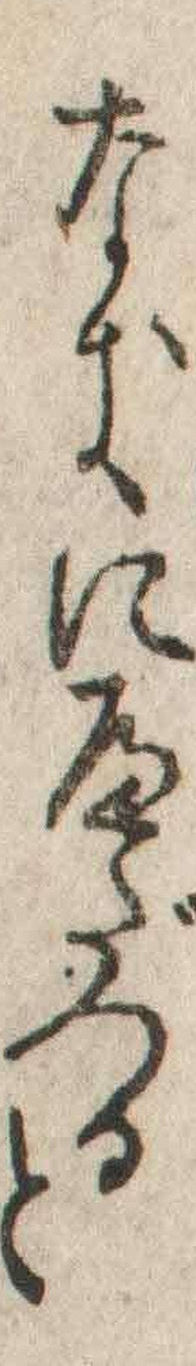なきにへだつると
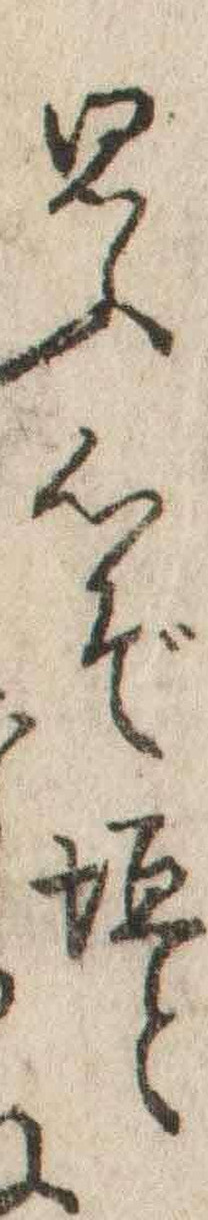思ふ心ぞ垣と
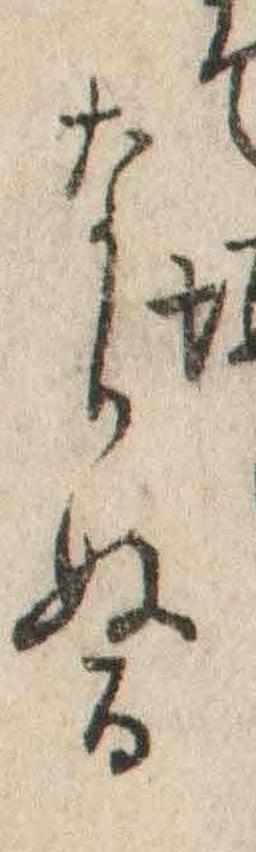なりぬる
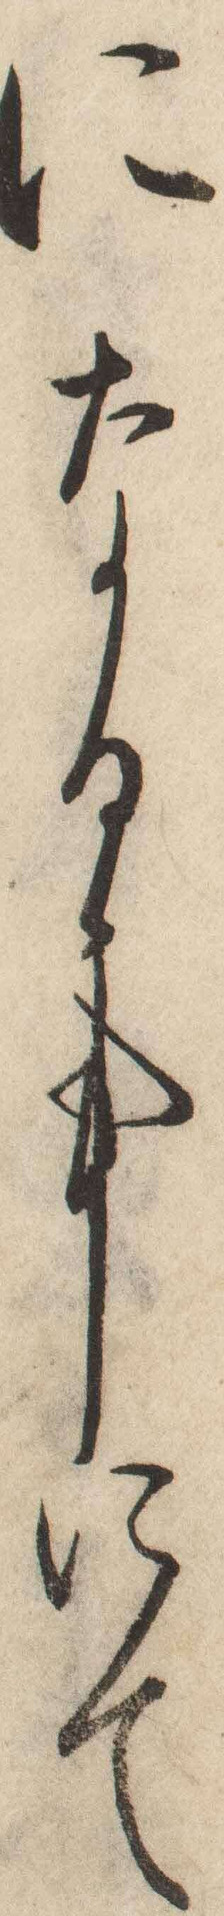になる事にて

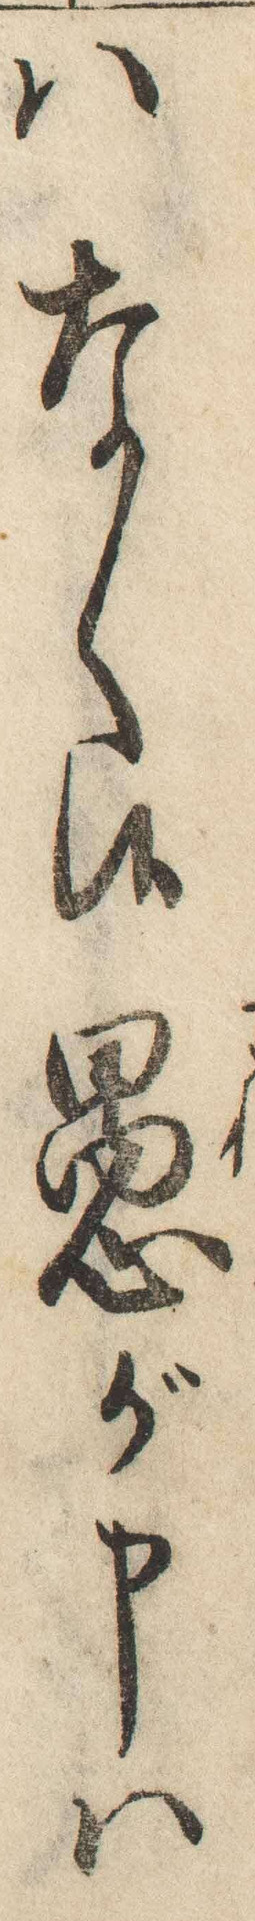はなく候愚が申は
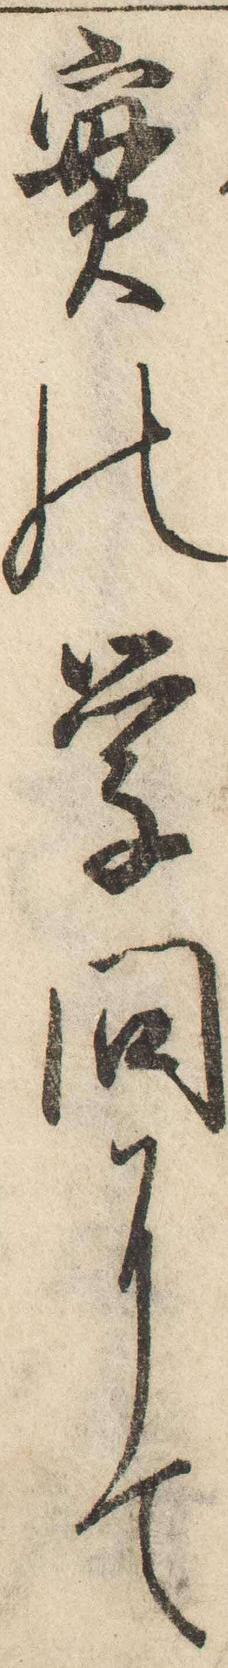実の学問にて
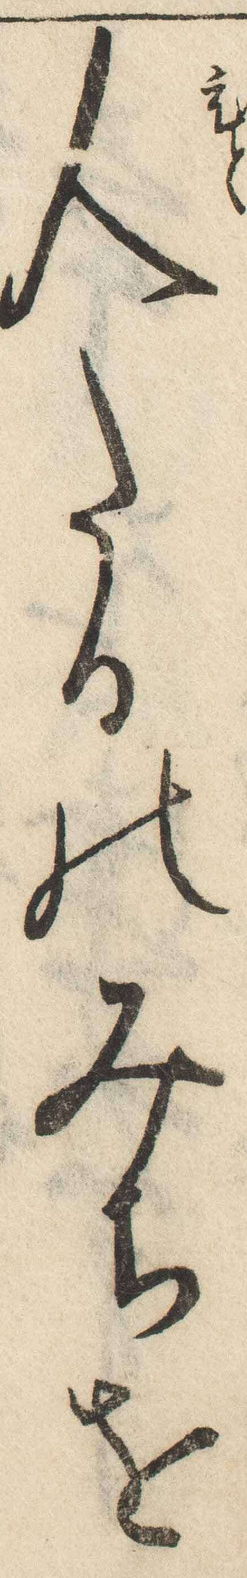人たるのみちを
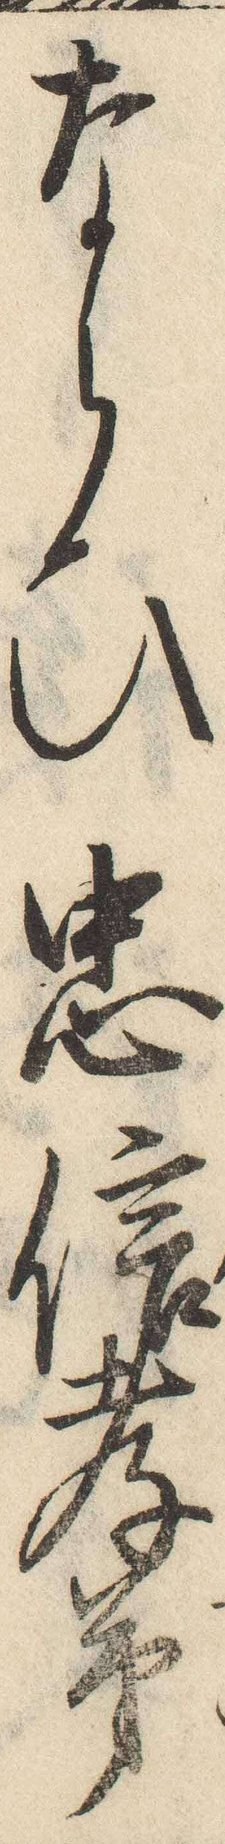ならひ忠信孝弟
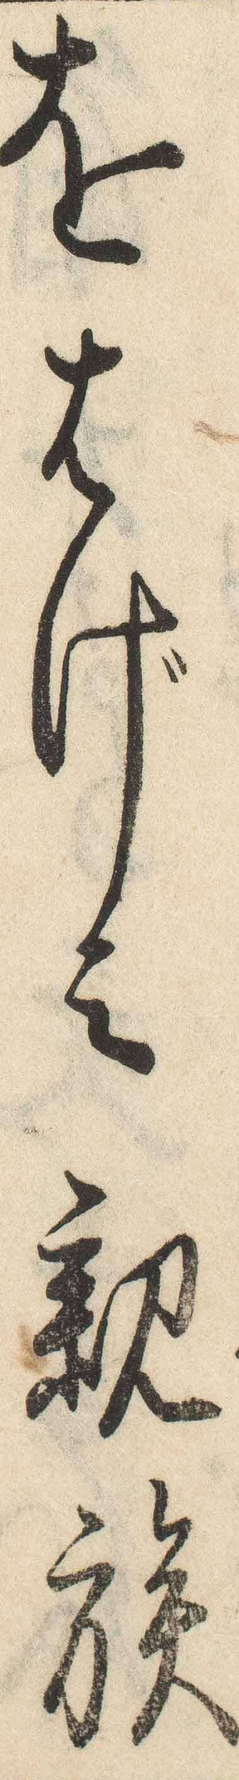をはげみ親族
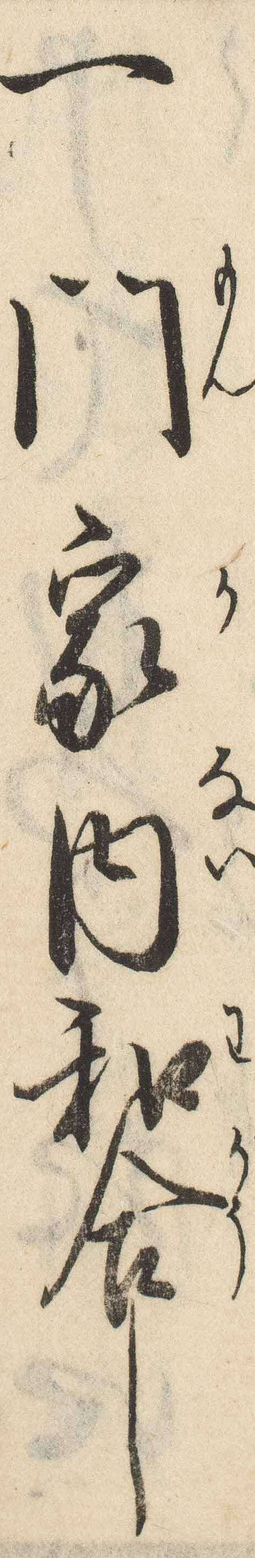一門家内和合し
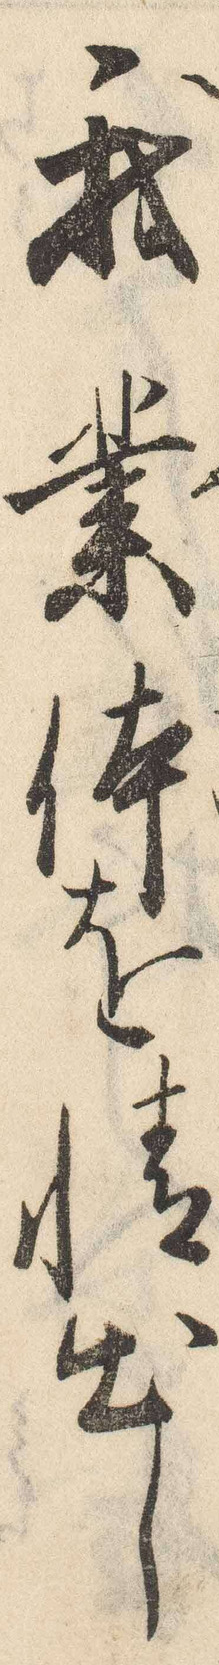我業体を精出し
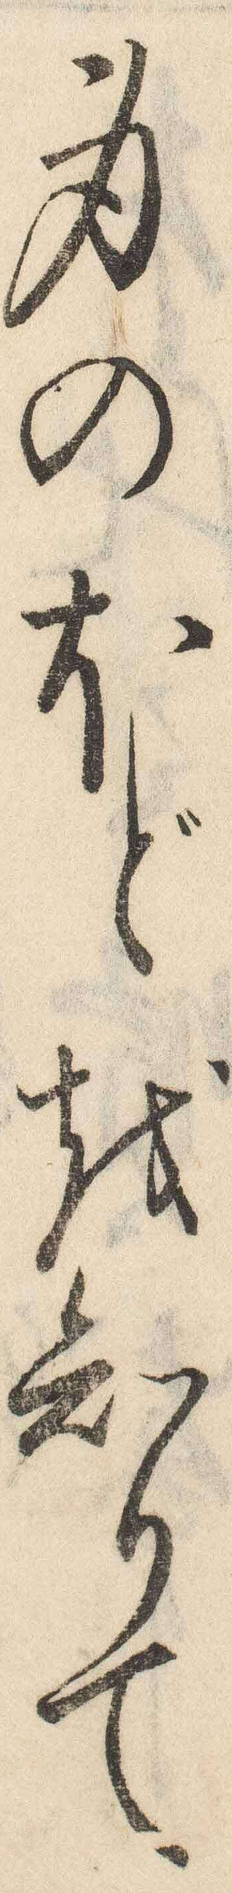身のほどを知りて
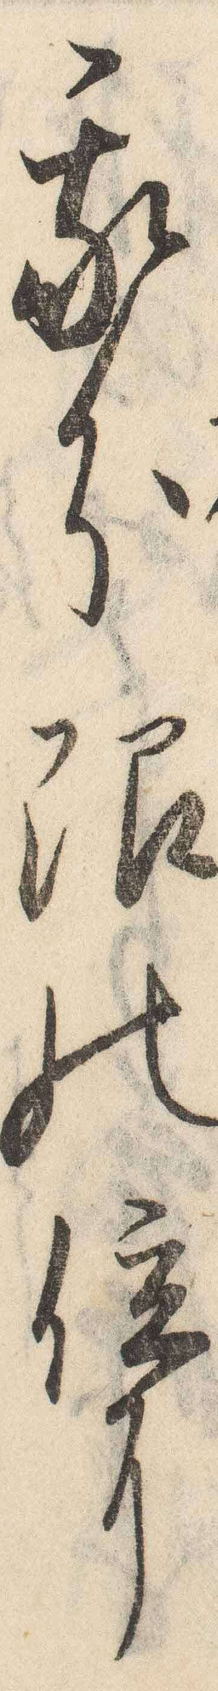我分限の位に
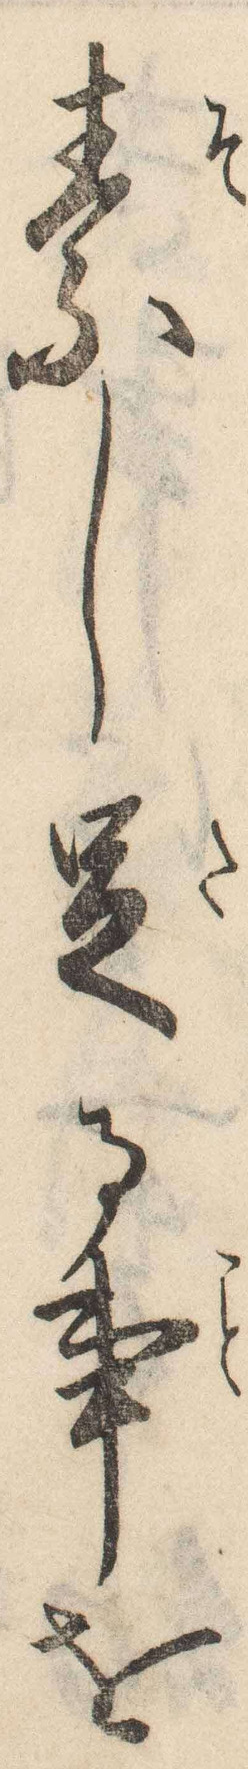素し足る事を
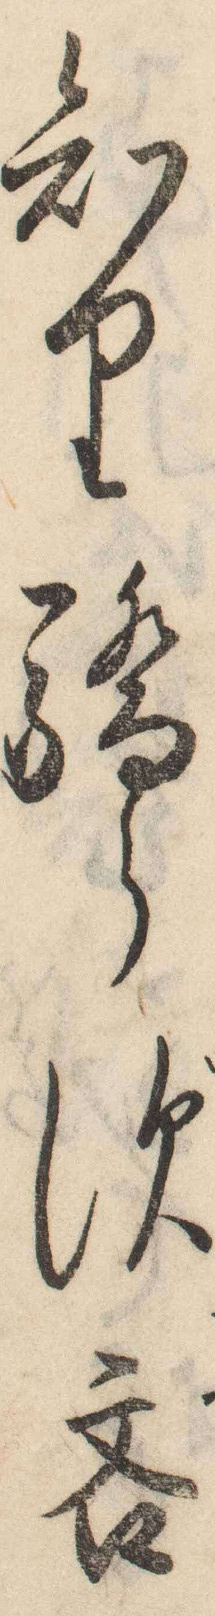知り驕らず吝
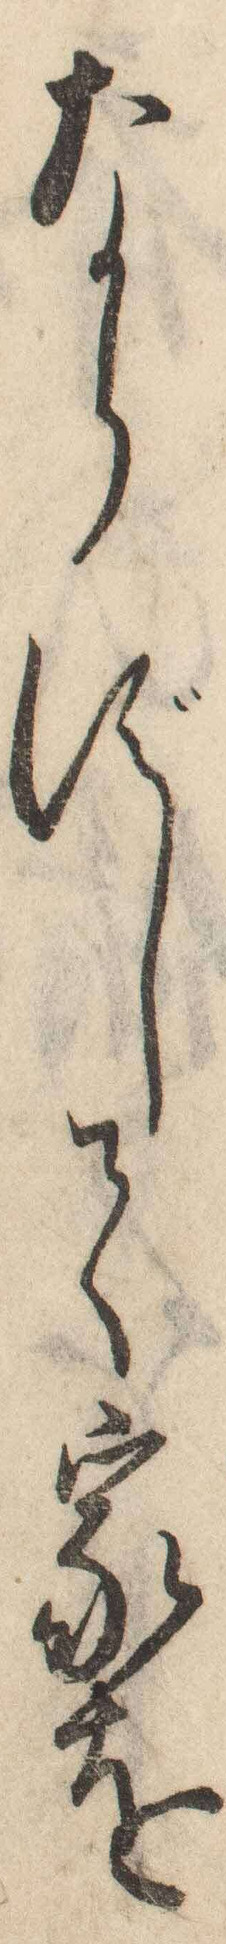ならずして家を
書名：撫育草
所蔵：東京学芸大学附属図書館 国文学研究資料館
